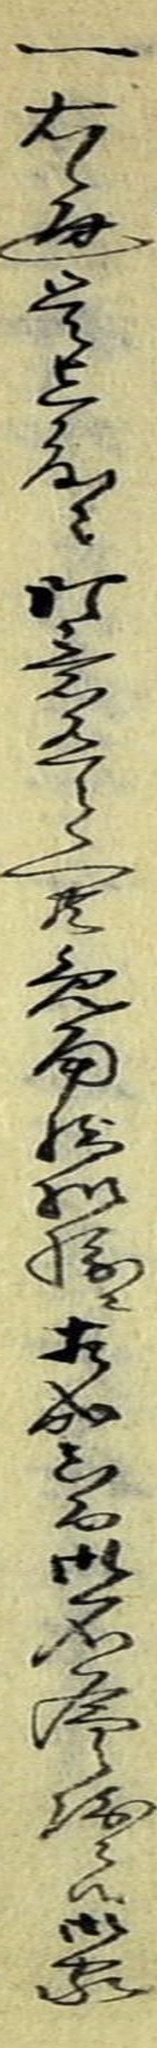一右之通是迄度々御意有之候へ共兎角指控勝ニ相成至而御不為之儀ニ候御家
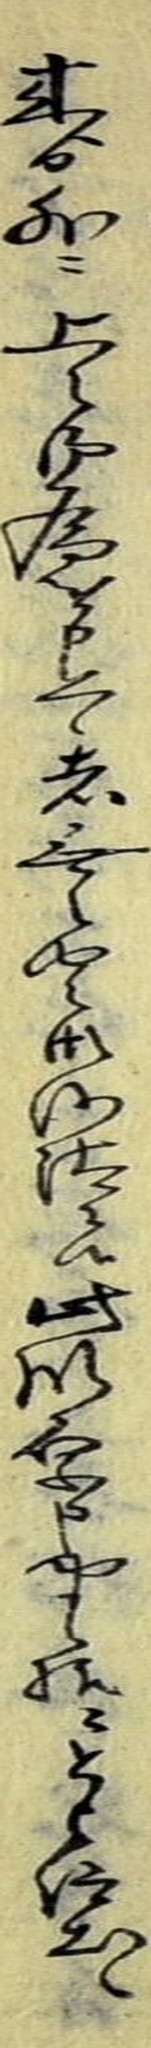来ゟ外ニ上之御為を申上候者無之由之御沙汰ニ候此段厚申聞候様ニと被仰出候
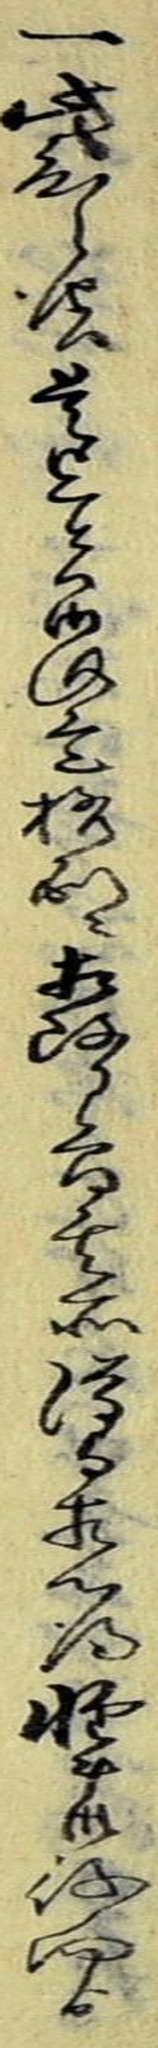一此度之儀ハ是迄とハ御趣意格別ニ相改り候間其所得与相心得軽キ御役向ゟ

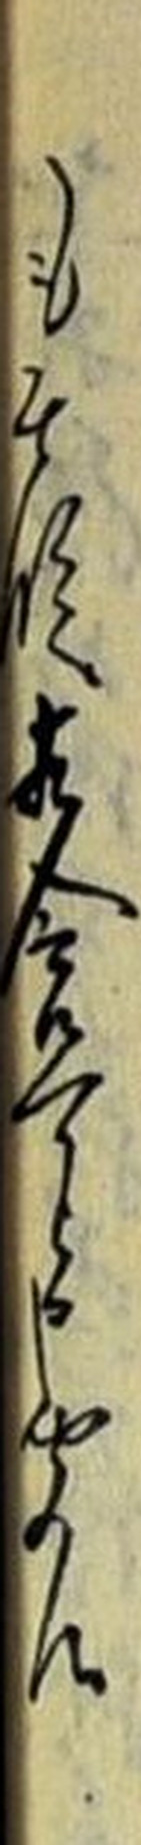へも其段相含可被申聞候

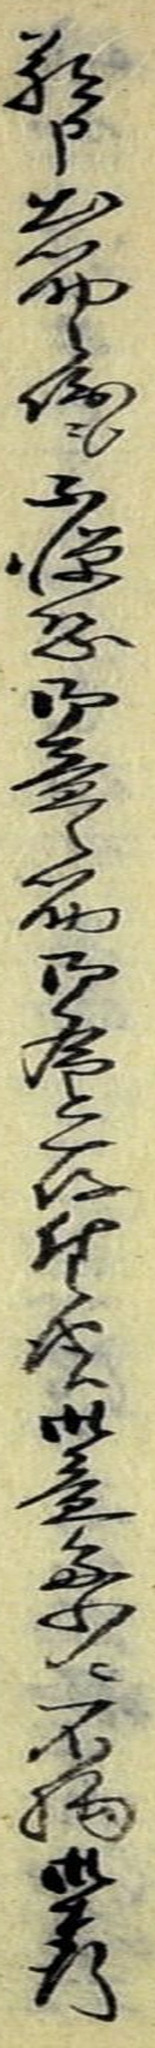難申出筋之儀も不憚恐御益之筋御為と存付候儀ハ御益多少ニ不拘御奉行
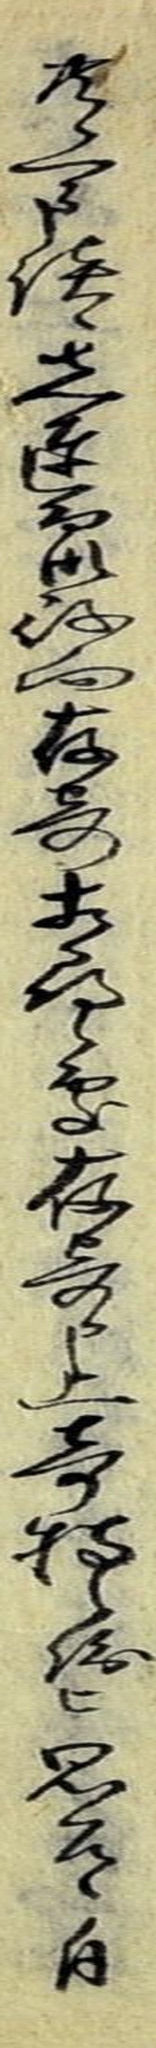共へ可申談候先達而御役向存寄相尋候処存寄申上奇特之儀被思召候自
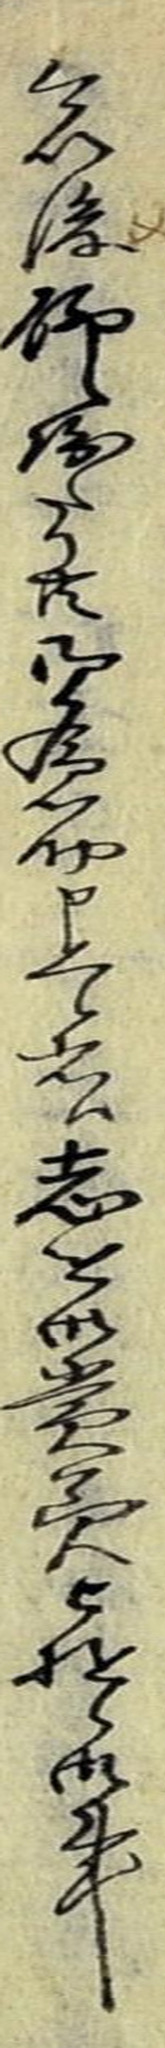今以後聊之儀たり共御為筋申上候者ハ志を御賞美被遊候御事
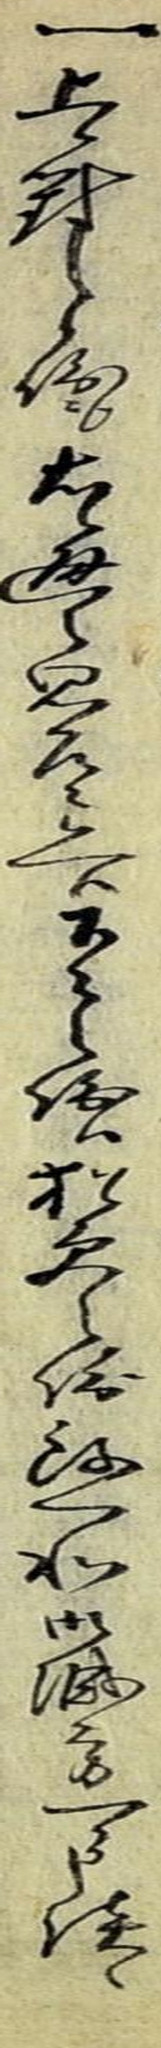一上へ対し候儀も右之通之思召ニ候ヘハ下々之儀ハ猶更之儀致一和御減方可申談候
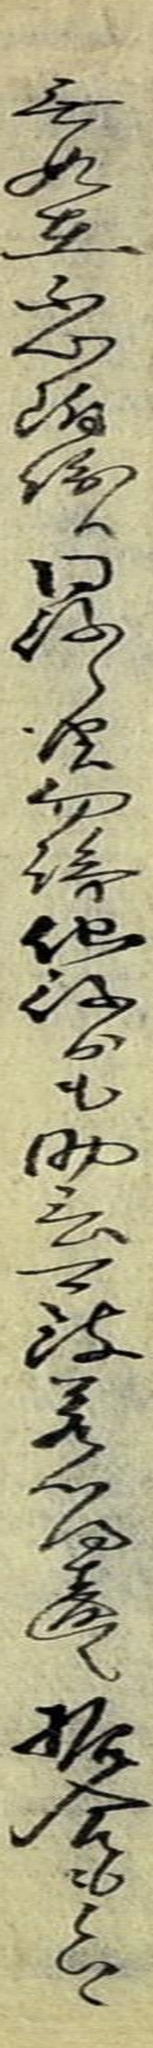無如在不心付儀ハ同役之儀ハ勿論他役ゟも助言可致若心得違之振合も候ハヽ
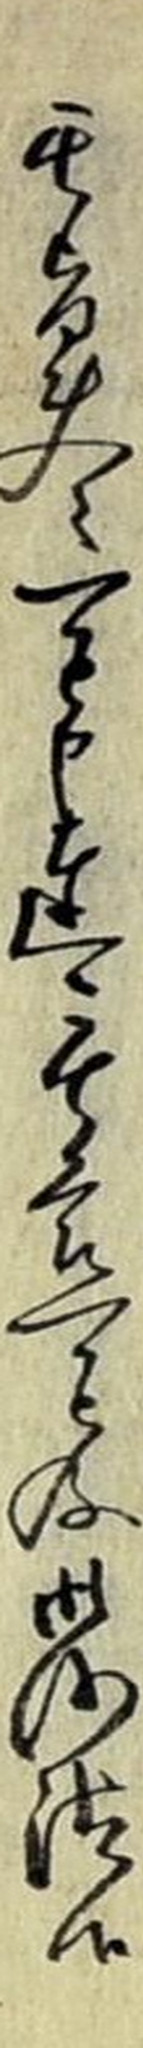其旨夫々可被申達候其節可被及御沙汰候
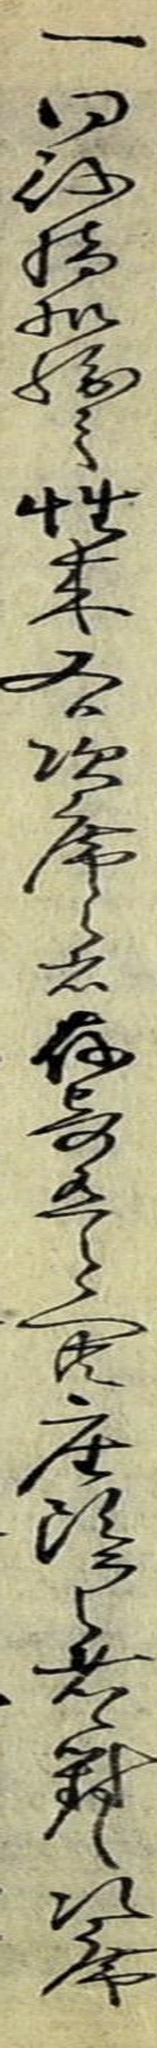一同役指控勝之性来又ハ次席之者存寄有之候へ共座頭之者へ対し次席
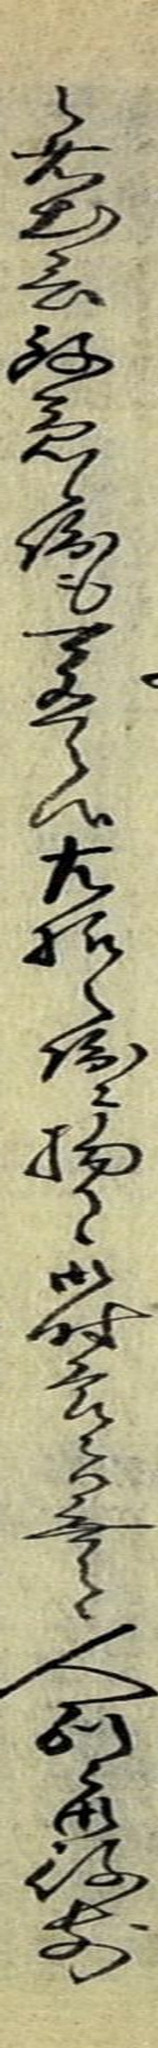之者出言致兼候儀も可有之候左様之儀ニ拘り候御時節ニハ無之候人別々御役前
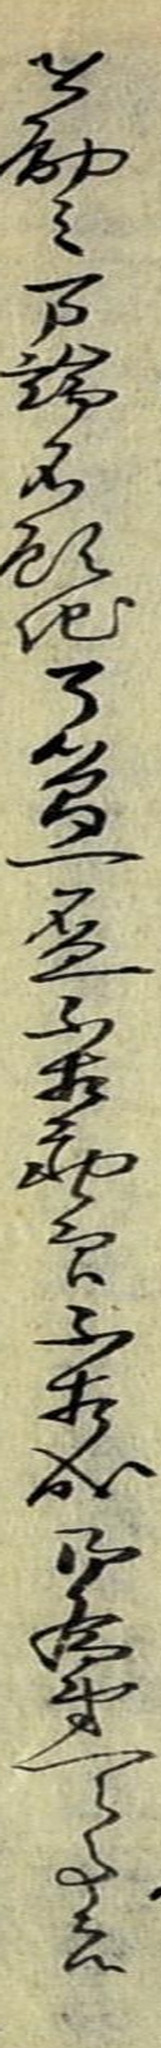を励ミ万端不顧他了簡一盃不相勤候而ハ不相成御為第一之事ニ候
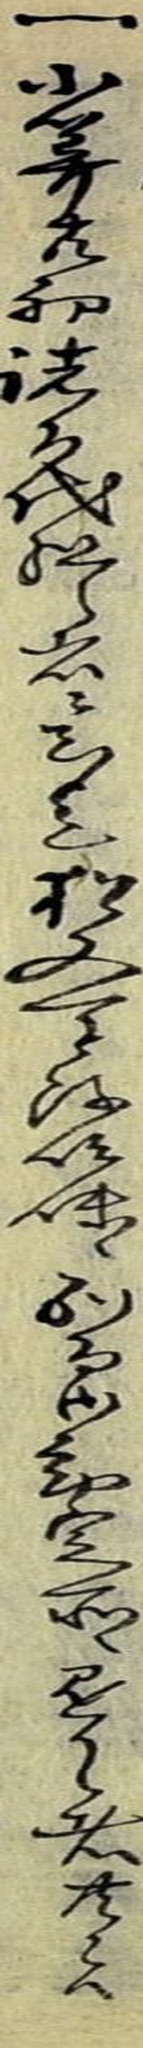一小算共初諸下代組之者ニ至迄猶又可被致吟味候別而御勘定所へ懸り候者共ニハ
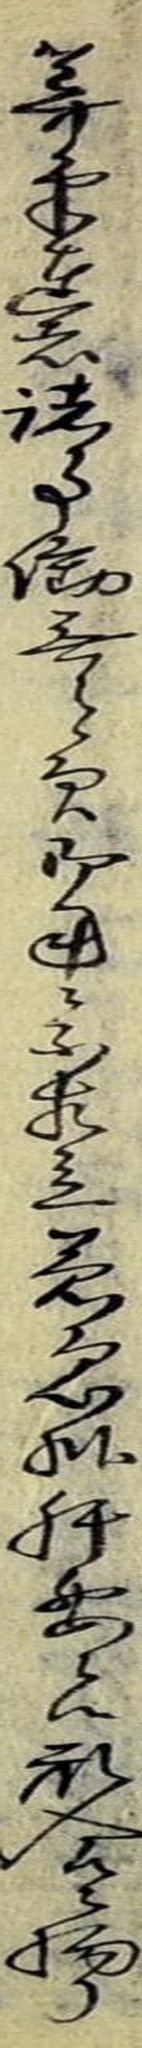算筆達者諸事働無之候而ハ御用ニ不相立兼而心掛肝要ニ候形合ニ拘り
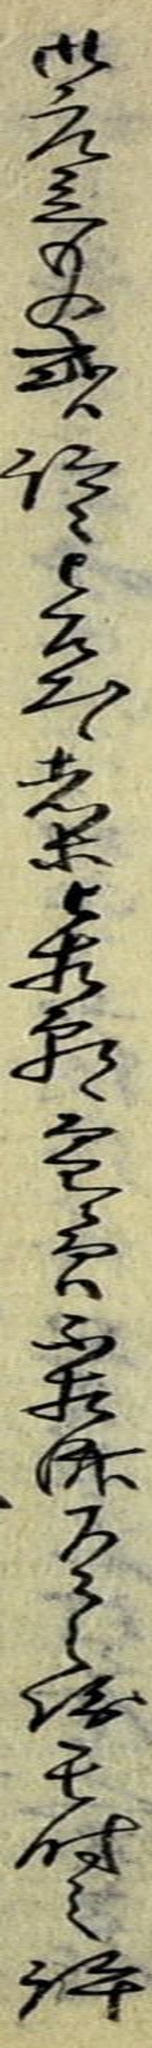御取立もの或ハ跡々被召出候者等被相願候而已ニ而ハ不相済下々之儀其時之評
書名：命令之部 三
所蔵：福井県文書館 Fukui Prefectural Archives
